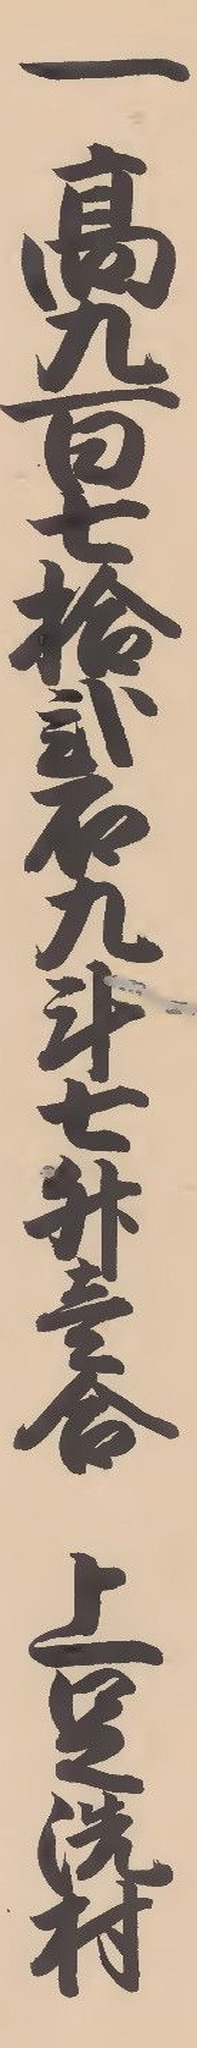一高九百七拾弐石九斗七升壱合上足洗村
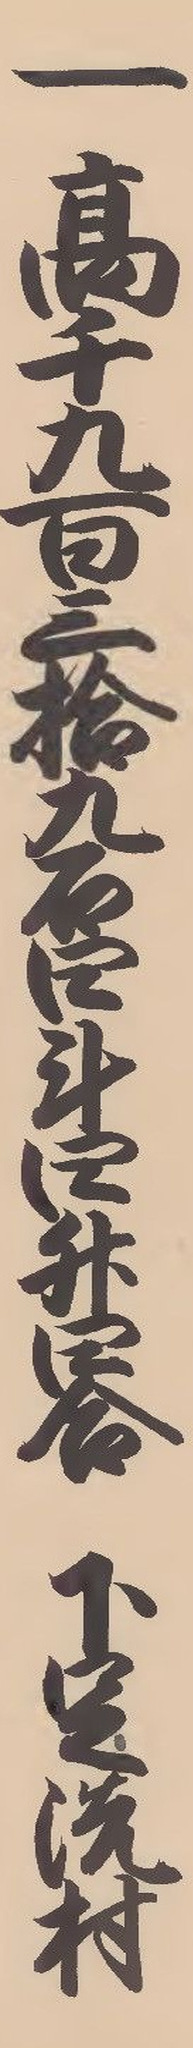一高千九百三拾九石四斗四升四合下足洗村
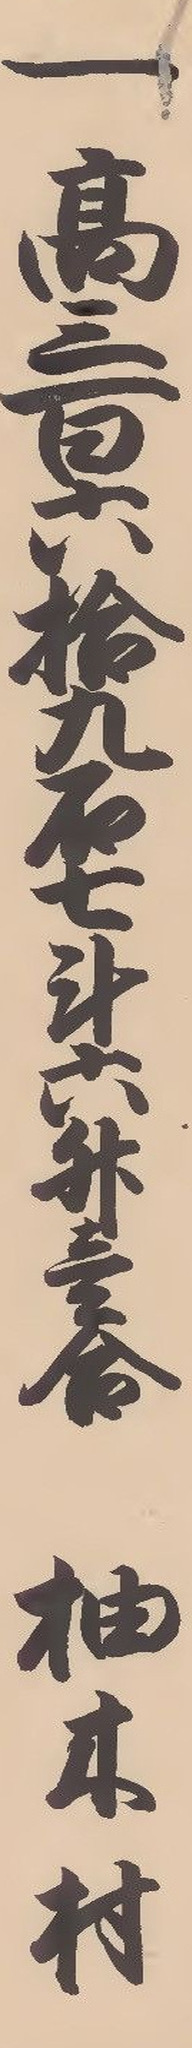一高三百六拾九石七斗六升壱合柚木村
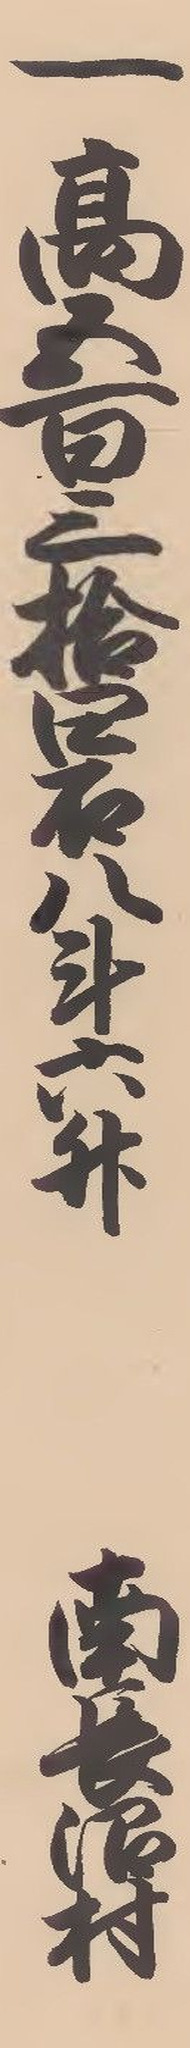一高五百三拾四石八斗六升南長沼村
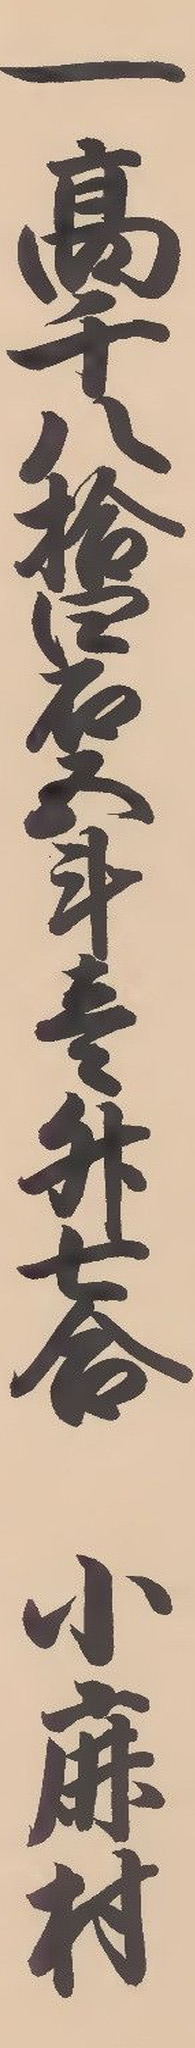一高千八拾四石五斗壱升七合小鹿村
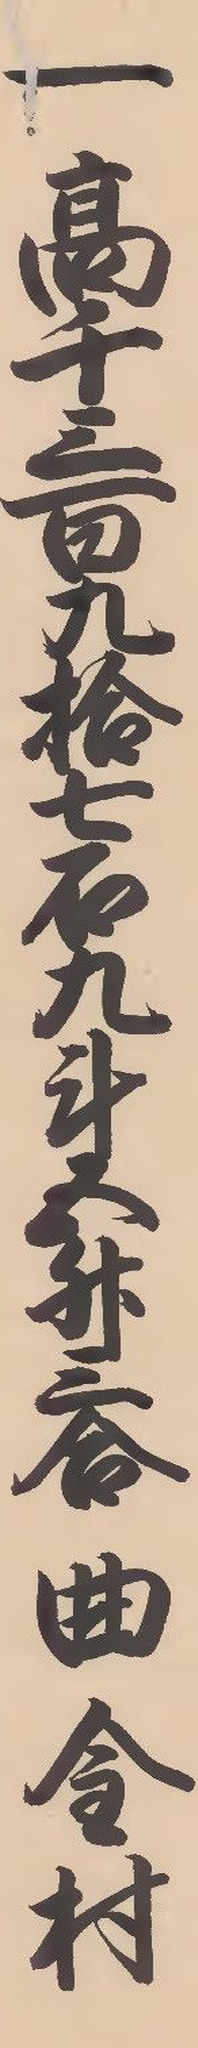一高千三百九拾七石九斗五升三合曲金村
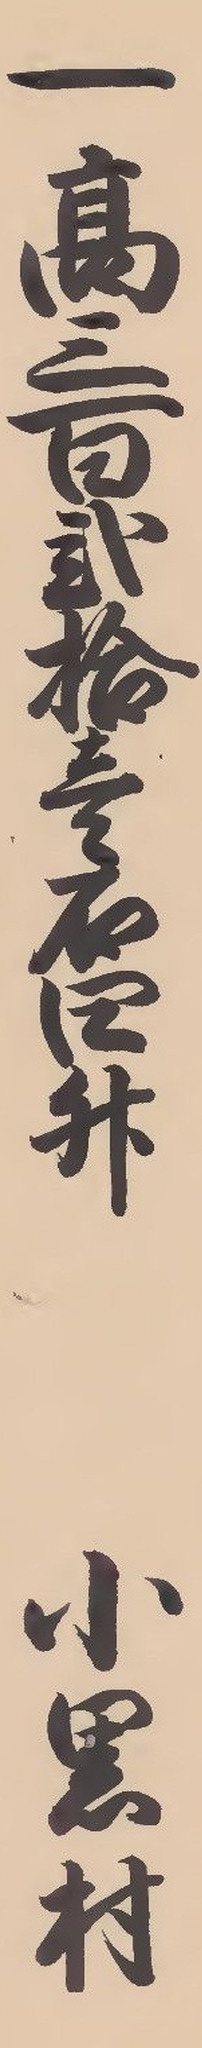一高三百弐拾壱石四升小黒村
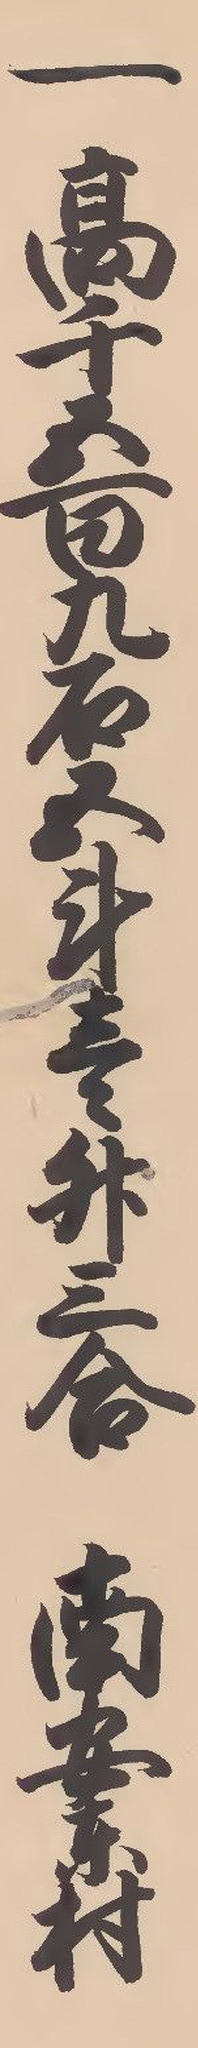一高千五百九石五斗壱升三合南安東村

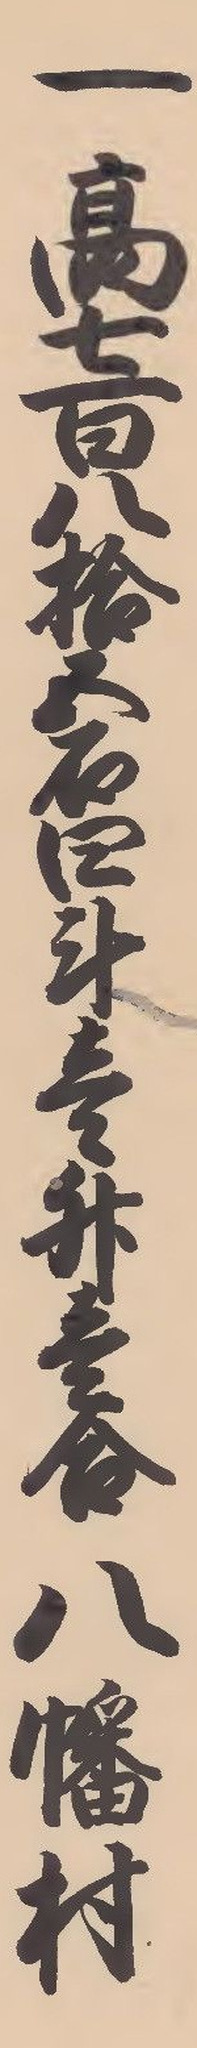一高七百八拾五石四斗壱升壱合八幡村
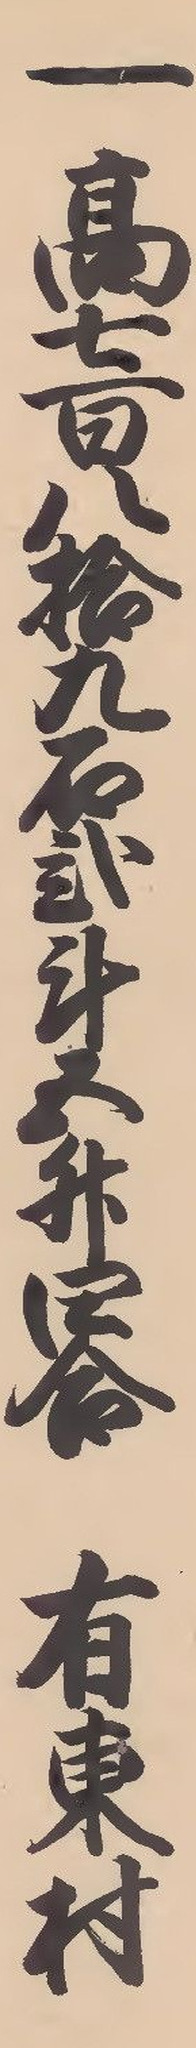一高七百八拾九石弐斗五升四合有東村
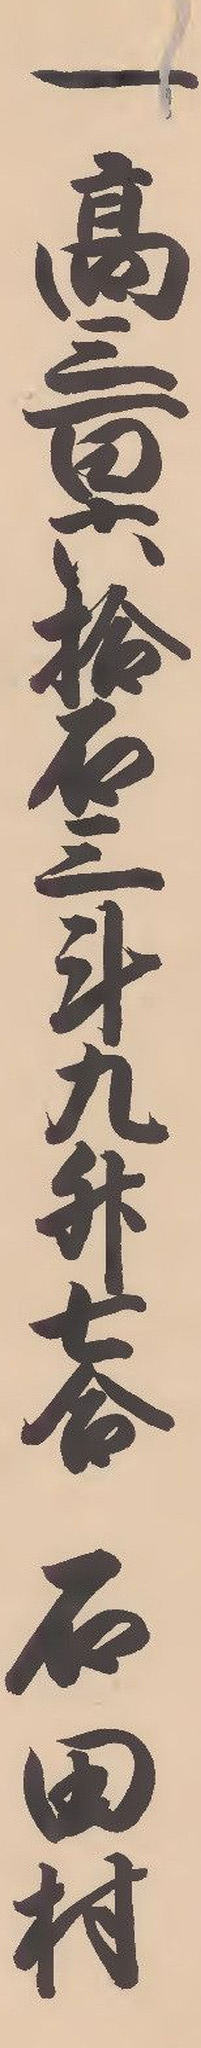一高三百六拾石三斗九升七合石田村
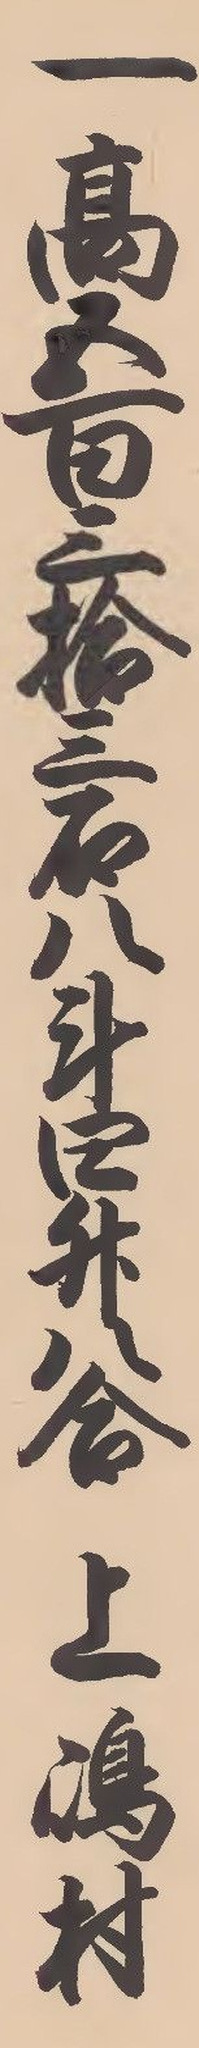一高五百三拾三石八斗四升八合上島村
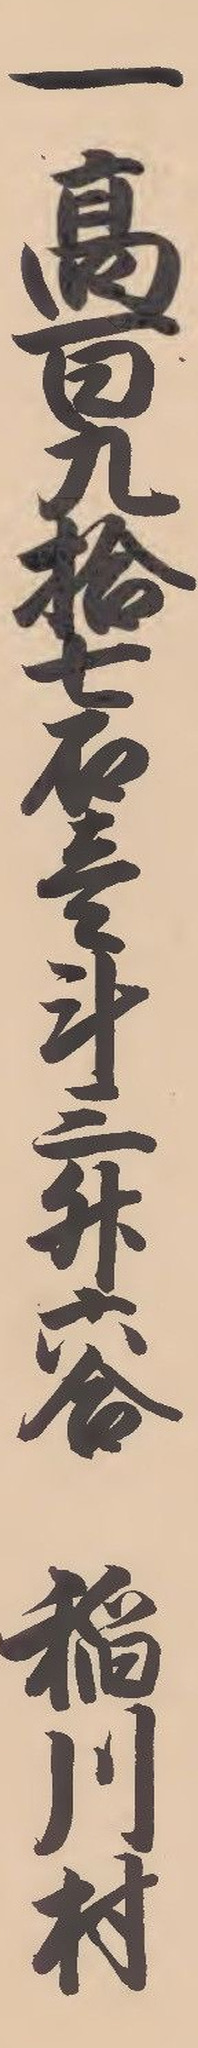一高百九拾七石壱斗三升六合稲川村
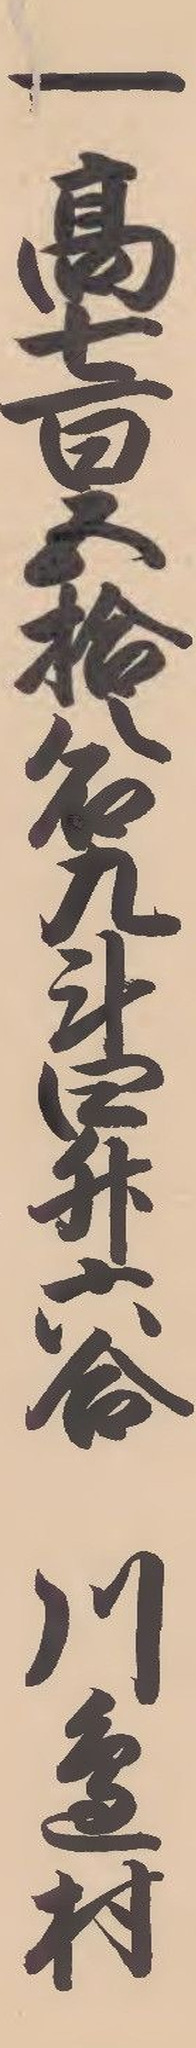一高七百五拾八石九斗四升六合川辺村
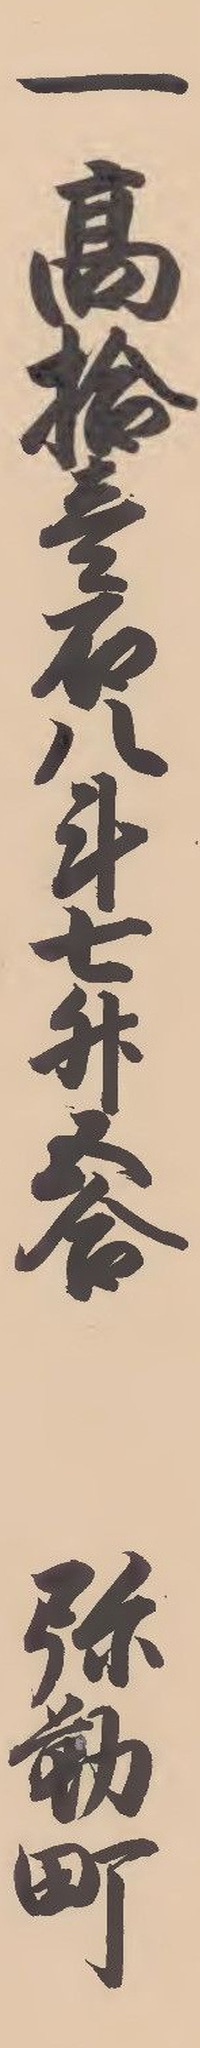一高拾壱石八斗七升五合弥勒町
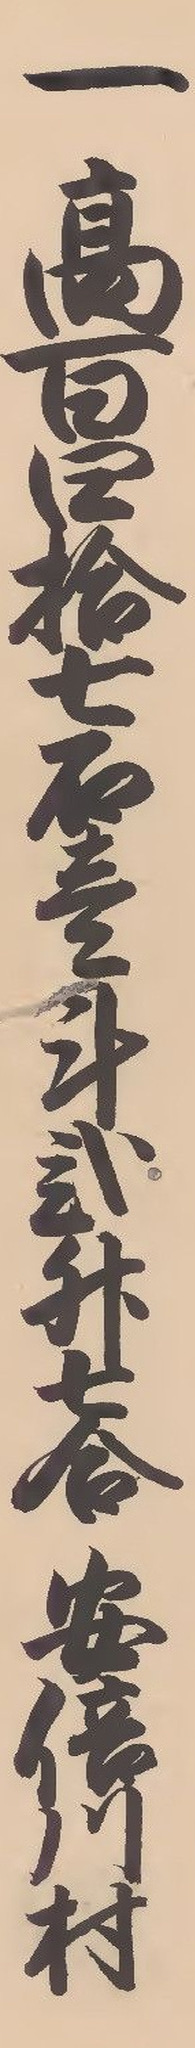一高百四拾七石壱斗弐升七合安倍川村
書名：駿河国郷帳
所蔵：国立公文書館 National Archives of Japan
